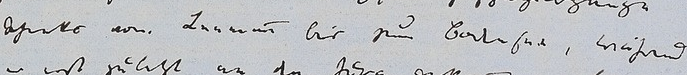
Schenks vom Leemann bis zum Bodensee, während
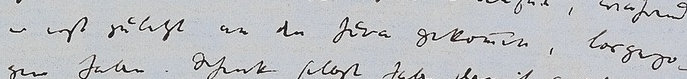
er erst zuletzt an den Jura gekommen, losgezo-
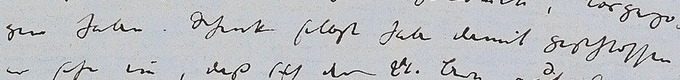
gen haben. Schenk selbst habe damit geschlossen,
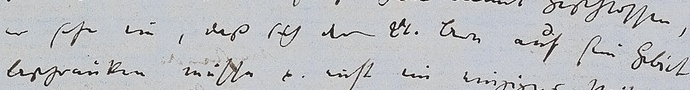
er sehe ein, daß sich der Kt. Bern auf sein Gebiet
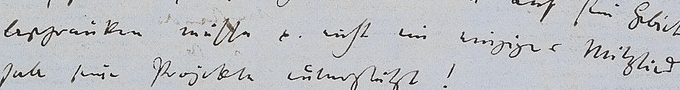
beschränken müsse &. nicht ein einziges Mitglied
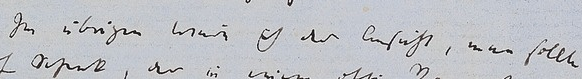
Im übrigen wäre ich der Ansicht, man sollte
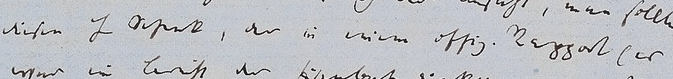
diesen Herrn Schenk, der in einem offiz. Rapport (es
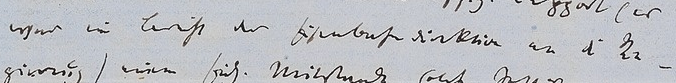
war ein Bericht der Eisenbahndirektion an die Re-
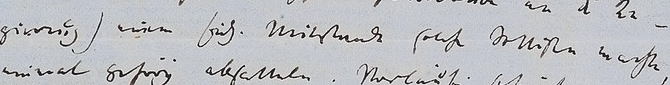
gierung) einem Eidg. Mitstande solche Sottisen machte,
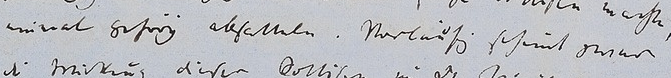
einmal gehörig absatteln. Vorläufig scheint zwar
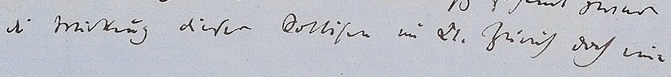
die Wirkung dieser Sottisen im Kt. Zürich doch eine
